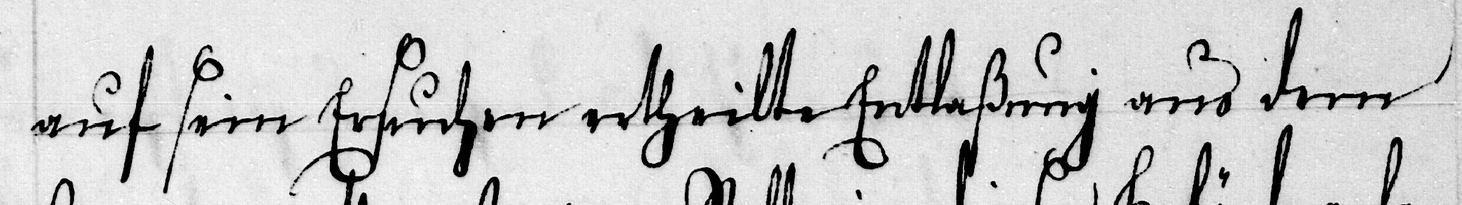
auf sein Ersuchen ertheilte Entlaßung aus dem
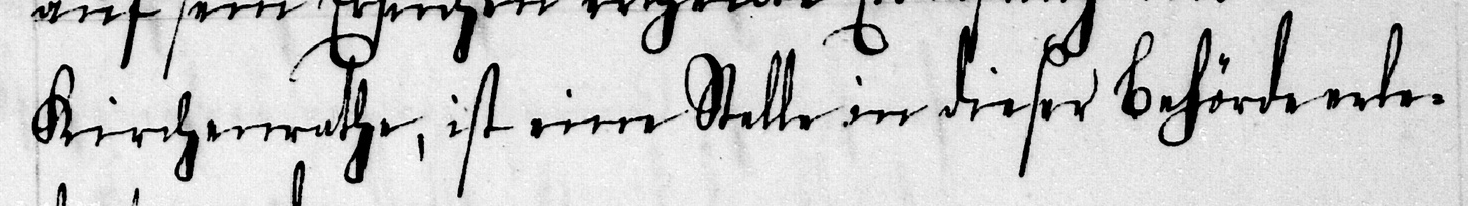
Kirchenrathe, ist eine Stelle in dieser Behörde erle¬
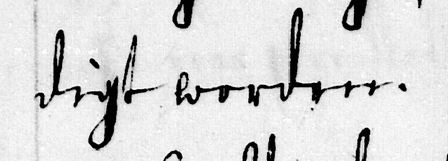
digt worden.
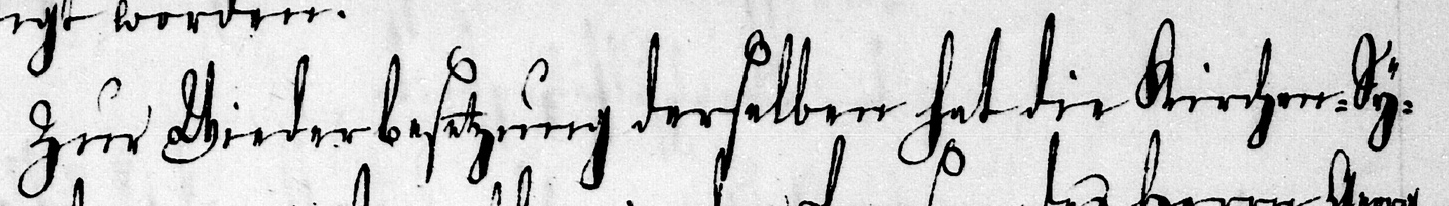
Zur Wiederbesetzung derselben hat die Kirchen-Sy¬
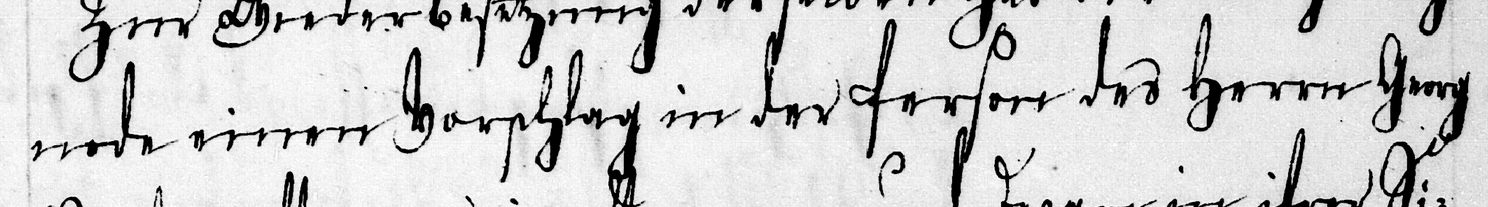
node einen Vorschlag in der Person des Herrn Georg
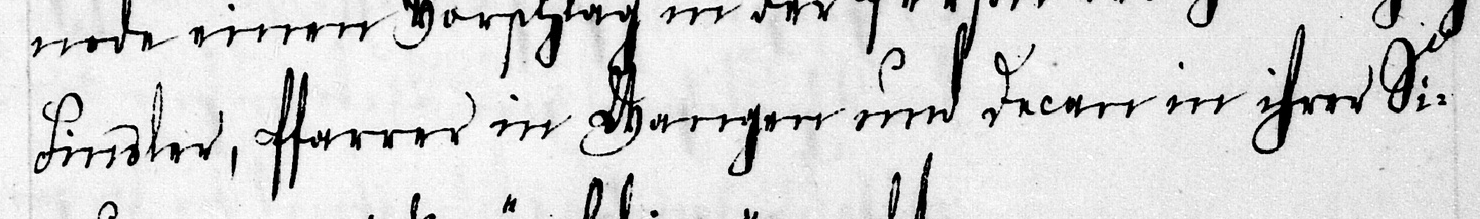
Finsler, Pfarrer in Wangen und Decan in ihrer Si¬
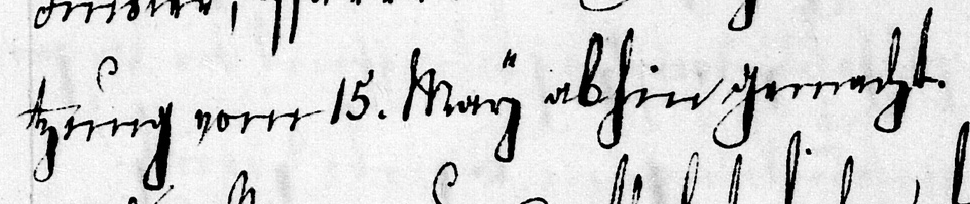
tzung vom 15. März abhin gemacht.
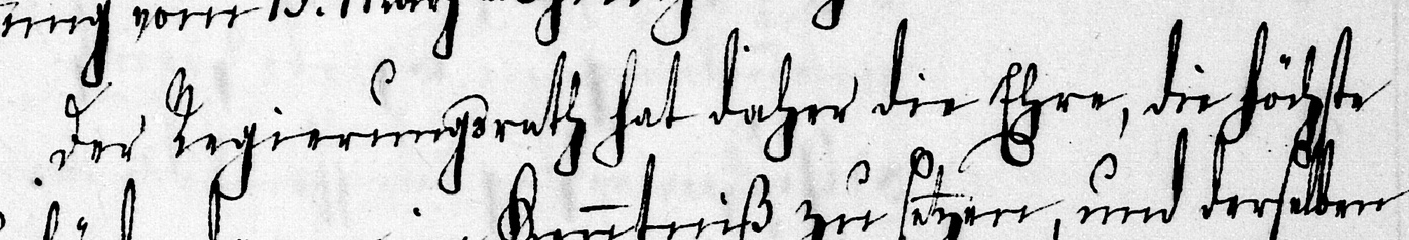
Der Regierungsrath hat daher die Ehre, die höchste
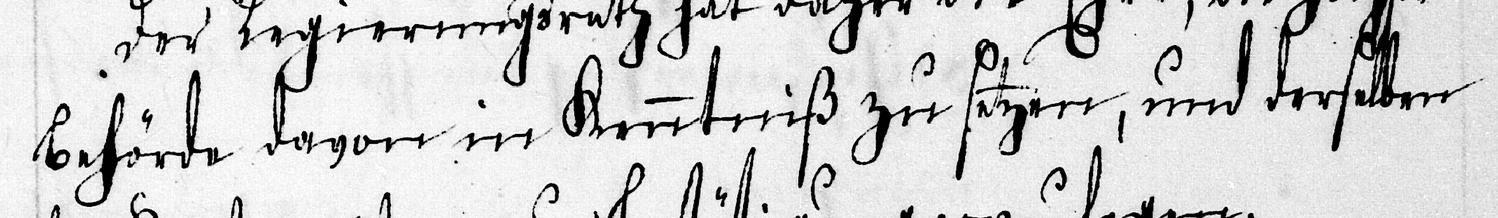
Behörde davon in Kenntniß zu setzen, und derselben
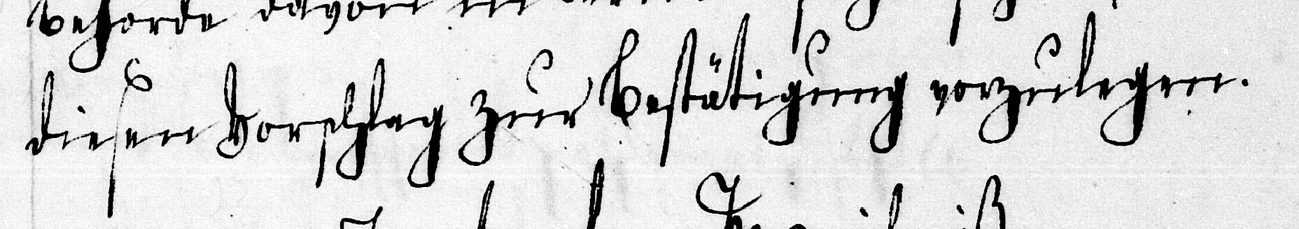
diesen Vorschlag zur Bestätigung vorzulegen.
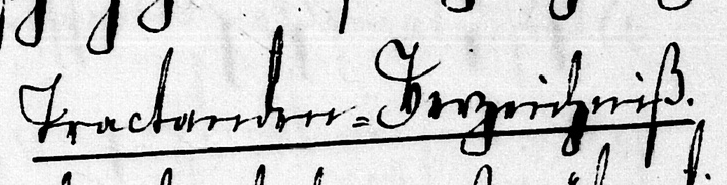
Tractanden-Verzeichniß.
